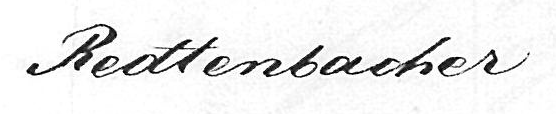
Redtenbacher
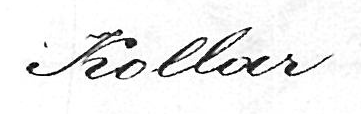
Kollar
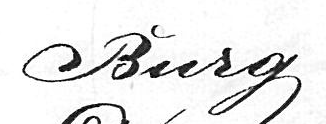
Burg
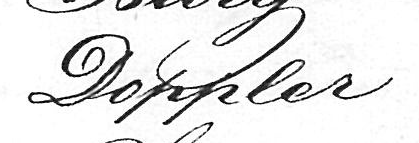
Doppler
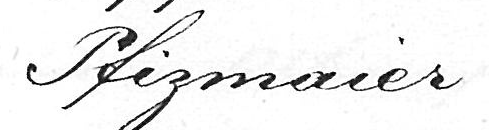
Pfizmaier
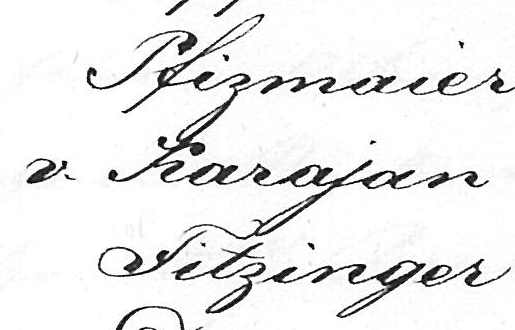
v. Karajan
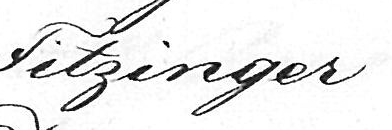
Fitzinger
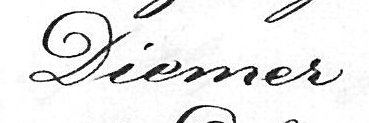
Diemer
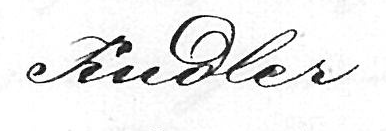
Sudler
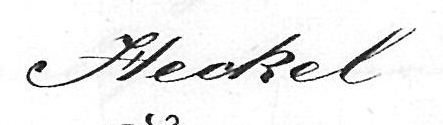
Heckel
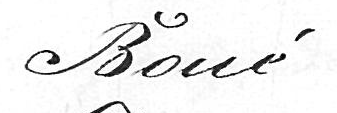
Boué
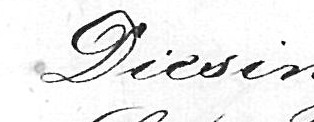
Diesing
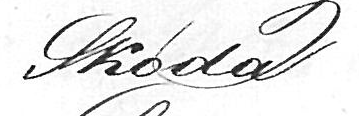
Skoda
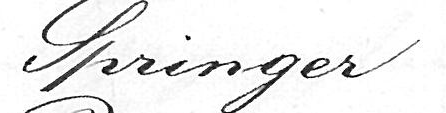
Springer
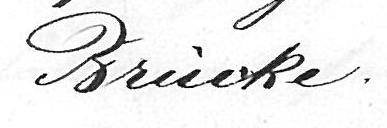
Brücke
